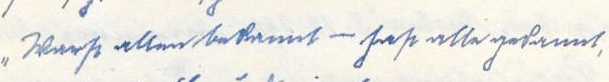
„Warst allen bekannt - hast alle gekannt,
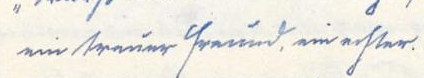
ein treuer Freund, ein echter.
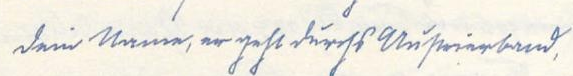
Dein Name, er geht durchs Austrierland
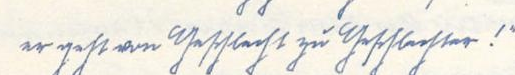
er geht von Geschlecht zu Geschlechter!“
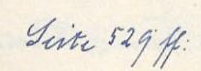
S. 529 ff.
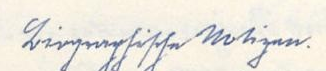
Biografische Notizen.
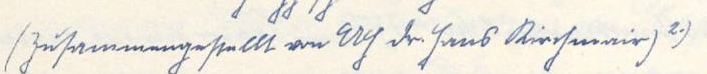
(zusammengestellt von AH Dr. Hans Kirchmair) 2)
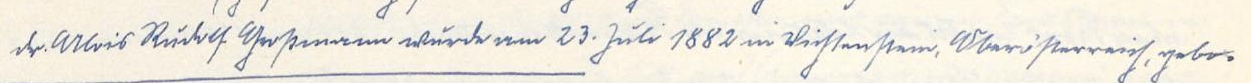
Dr. Alois Rudolf Großmann wurde am 23 Juli 1882 in Vichtenstein, Oberösterreich gebo-
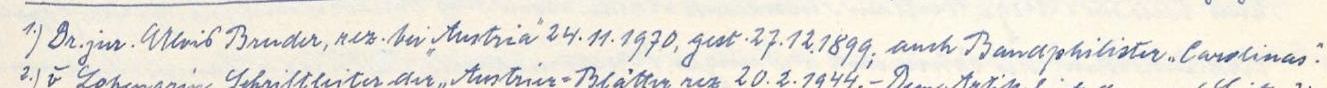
1) Dr. ir. Alois Bruder, rez. bei „Austria“ 24.11.1970 gest. 27.12.1899; auch Bandphilister „Carolinas“.
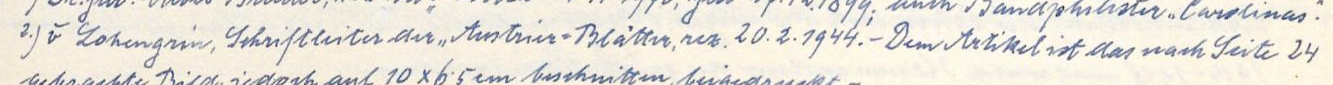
2) v/o Lohengrin, Schriftleiter der „Austrier-Blätter, rez. 20. 2. 1944.- Dem Artikel ist das nach Seite 2
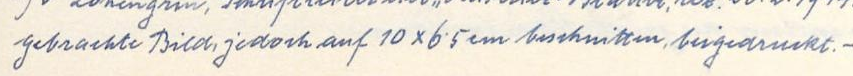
gebrachte Bild jedoch auf 10 x 6.5 bestritten beigedruckt.-
